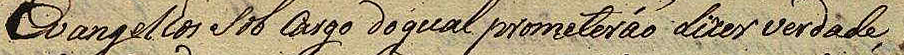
Evangelhos sob cargo do qual prometeráõ dizer verdade,
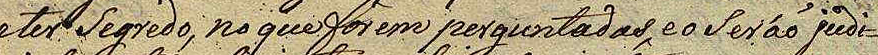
e ter segredo, no que forem perguntadas, e o serão judi
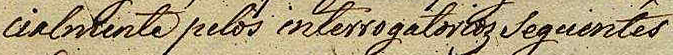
cialmente pelos interrogatorioz seguintes
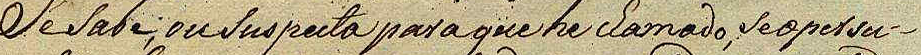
Se sabe, ou suspeita para que he chamado, se o persu
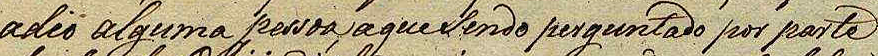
adio alguma pessoa, a que sendo perguntado por parte
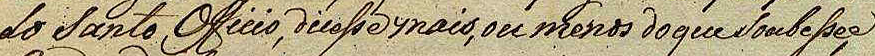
do Santo Officio, dicesse mais, ou menos do que soubesse, e
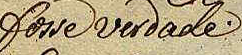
fosse verdade.
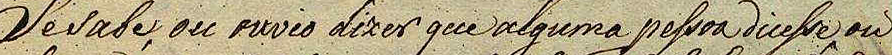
Se sabe, ou ouvio dizer que alguma pessoa dicesse, ou
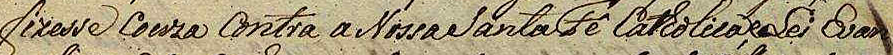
fizesse couza contra a Nossa Santa Fé Catholica, e Lei Evan
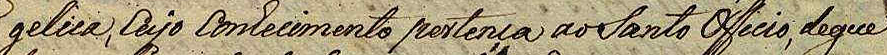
gelica, cujo conhecimento pertença ao Santo Officio, de que
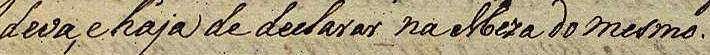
deva, e haja de declarar na Meza do mesmo.
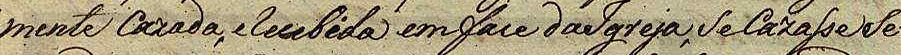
mente cazada, e Recebida em face da Igreja, se cazasse se
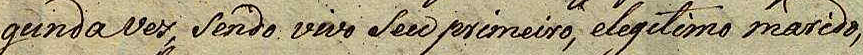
gunda vez, sendo vivo seu primeiro, e legitimo marido,
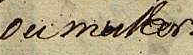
ou mulher:
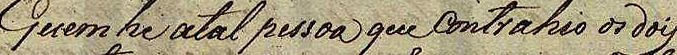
Quem he a tal pessoa que contrahio os dois
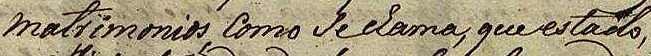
matrimonios, como se chama, que estado,
